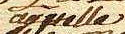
aquelle
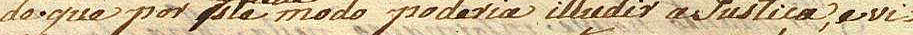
de que por este modo poderia illudir a Iustiça, evi
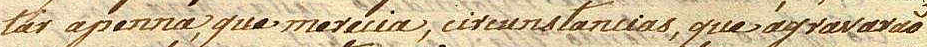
tar a penna que merecia, circunstancias que agravaraõ
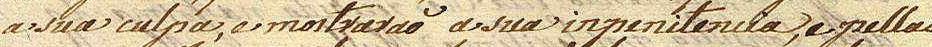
a sua culpa, a mostraraõ a sua inpenitencia, e pellas
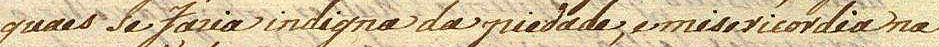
quaes se fazia indigna da piedade, e misericordia na
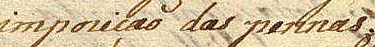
impoziçaõ das penas.
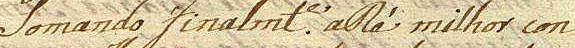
Tomando finalmt.e a Ré milhor con
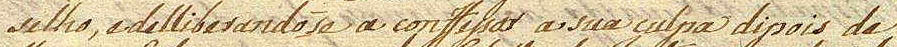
selho, e delliberando-se a conffessar a sua culpa dipois de
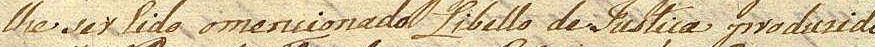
lhe ser lido o mencionado Libello de Iustiça produzido
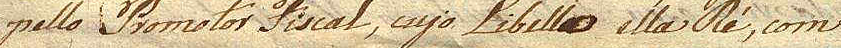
pello Promotor Fiscal, cujo Libello ella Ré, com
